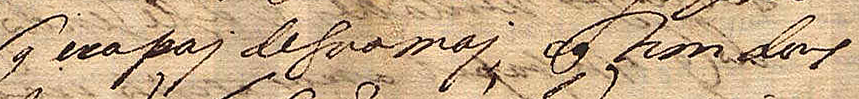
q̄ era paj de sua maj, e q̄ tem dous
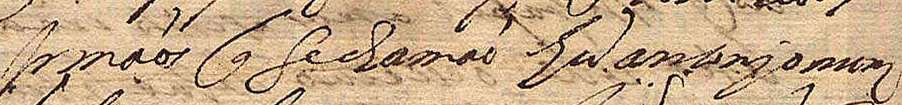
Jrmaõs q̄ se chamaõ hū antonjo nunz̄
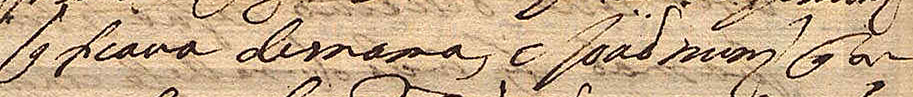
q̄ ficaua de mama, e Joaõ nunz̄ q̄ a
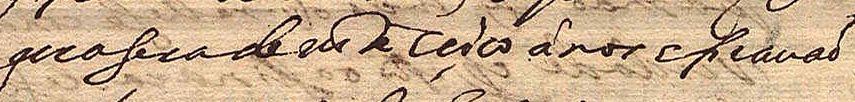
gora sera de uīte cinco anos e ficauaõ
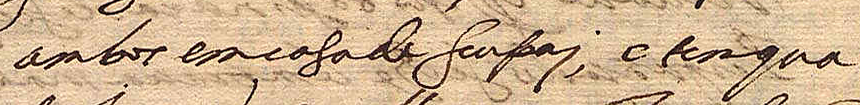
ambos em casa de seu paj, e ten qua
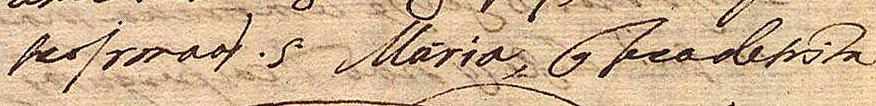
tro Jrmaās .s. Maria, q̄ sera de trīta
